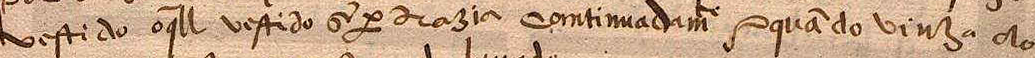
vestido o q̄ll vestido sēꝑ trazia comtinuadamte e quādo vinha Ao
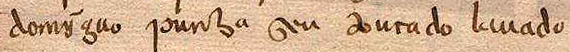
domȳguo punha seu toucado lauado
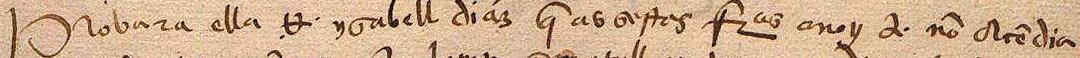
Provara ella .R· ysabell diaz q̄ as sestas fras a noyte nō Acēdia
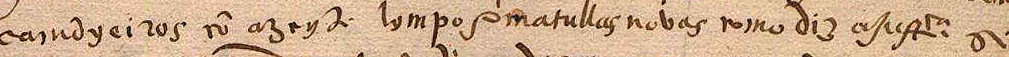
camdyeiros cō azeyte lympo e matullas novas como diz a Justca. se
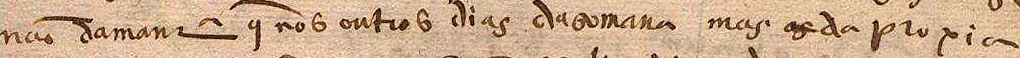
não da manra q̄ nos outros dias da somana mas os da propia
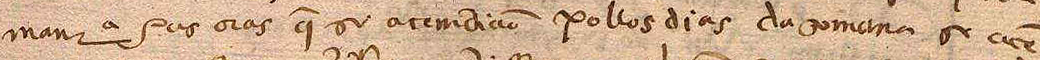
manra e as oras q̄ se acemdião pollos dias da somana se açē
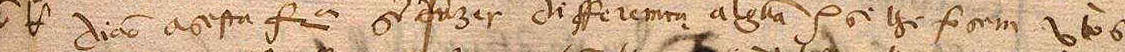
dião a sesta fra sē fazer differemça algūa e se lhe fosem vtos
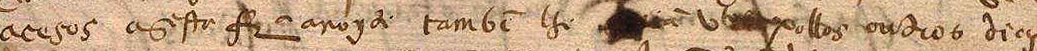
acesos a sesta fra a noyte tambē lhe _iā vtos pollos outros dias
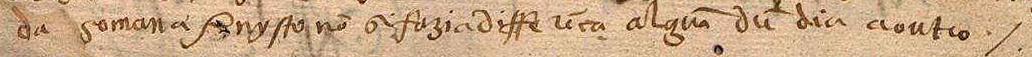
da somana e nysto nō se fazia differēça alguā dū dia a outro ·/.
